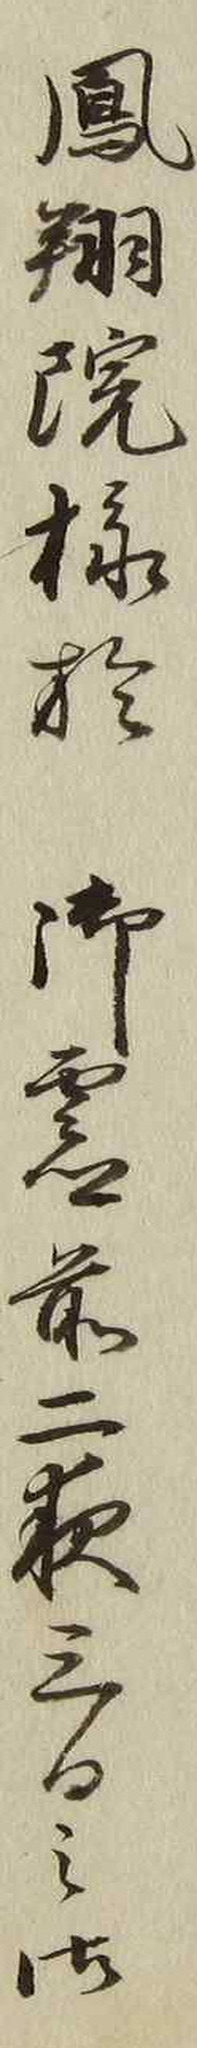鳳翔院様於御霊前二夜三日之御
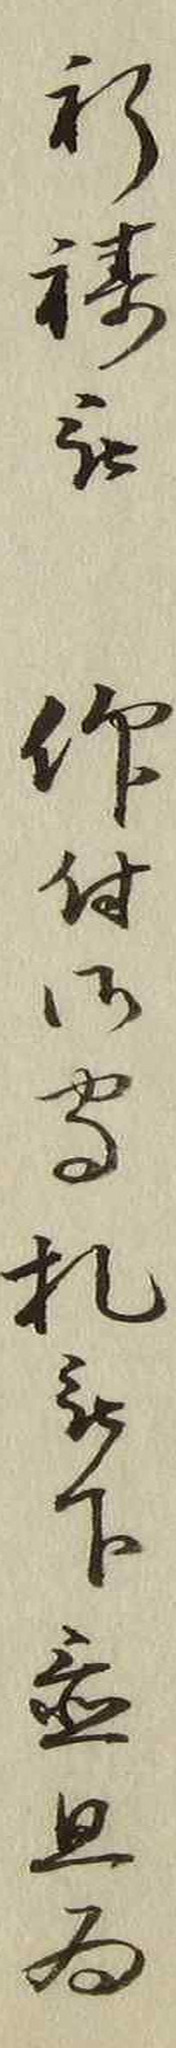祈祷被仰付御守札被下置且為
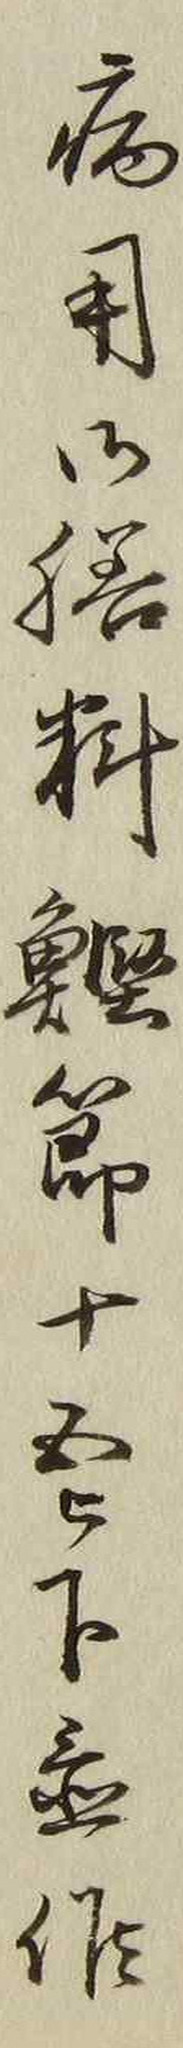病用御膳料鰹節十五被下置候
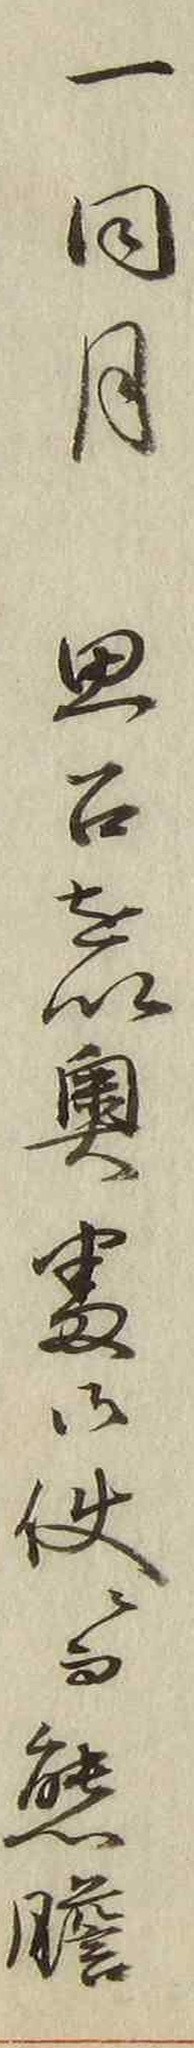一同月思召を以奥番御使に而熊膽
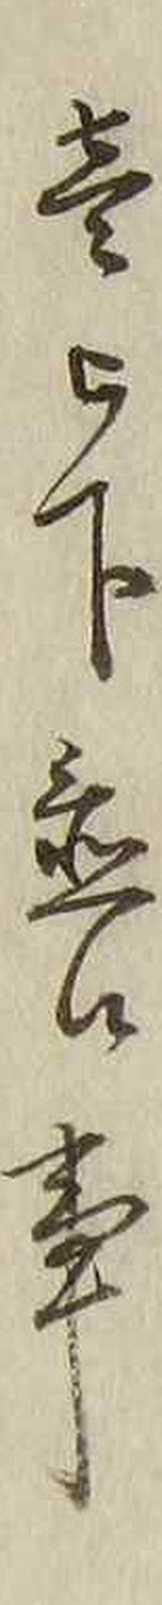壱被下置候事
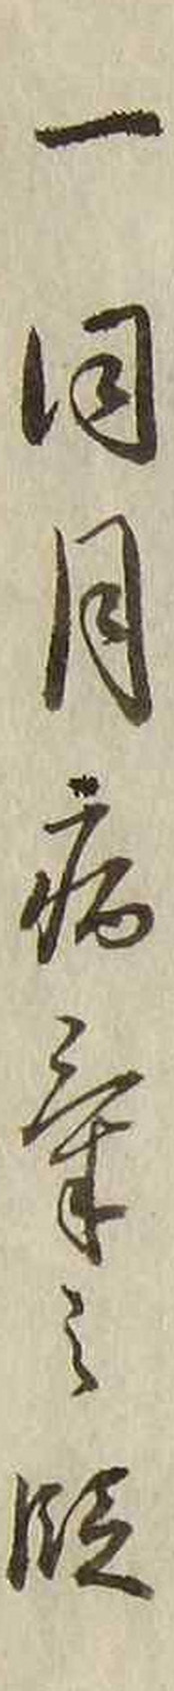一同月病気之段

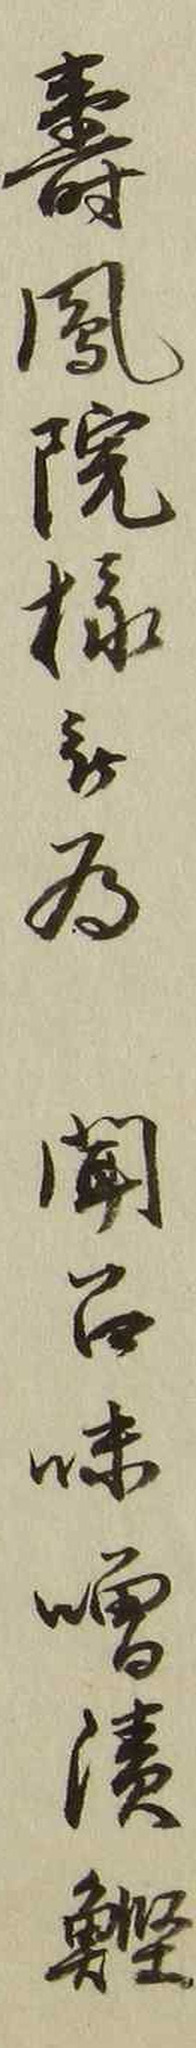寿鳳院様被為聞召味噌漬鰹
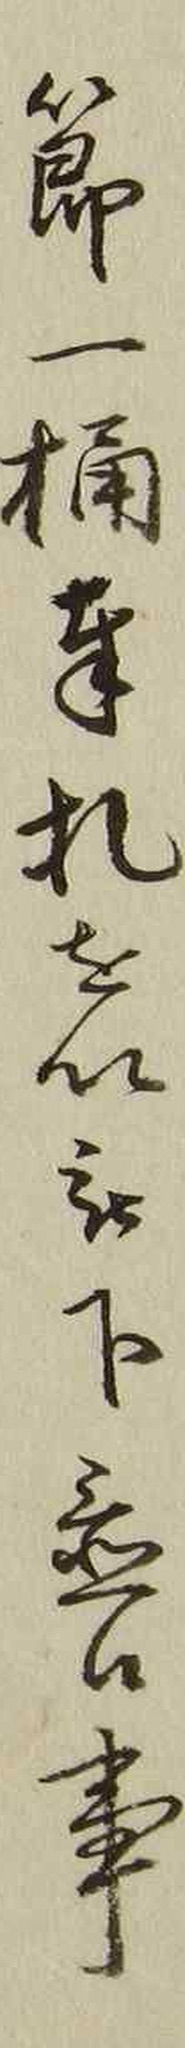節一桶奉札を以被下置候事
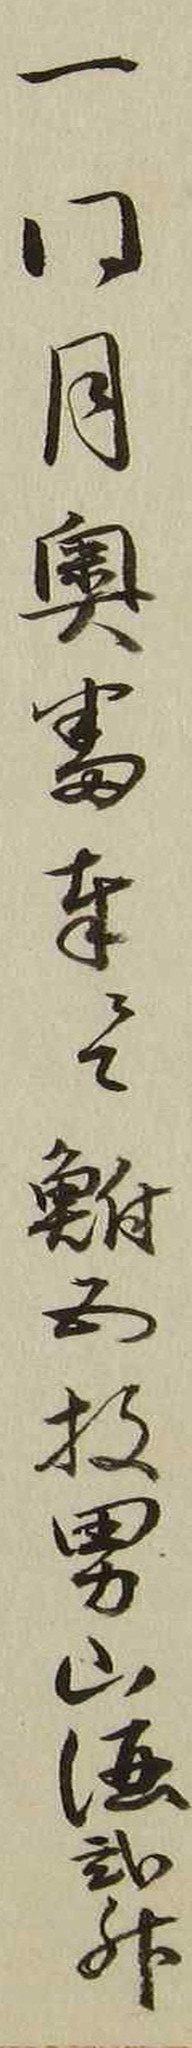一同月奥番奉にて鮒五枚男山酒弐升
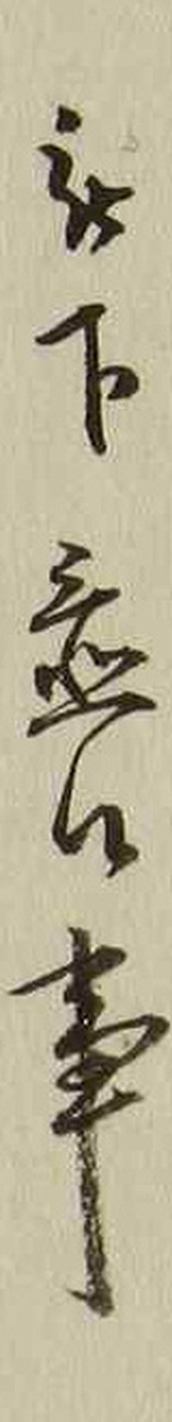被下置候事
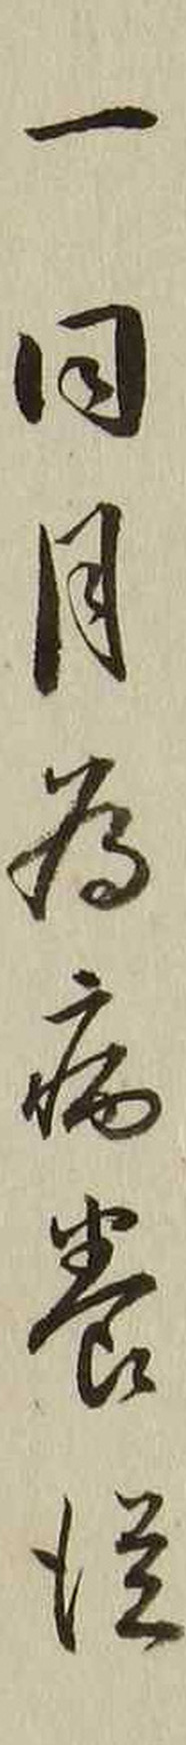一同月為病養従
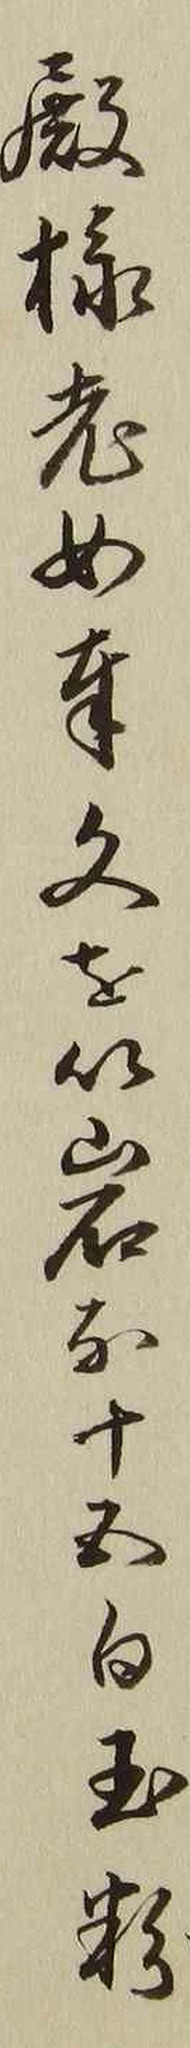殿様老女奉文を以岩な十五白玉粉
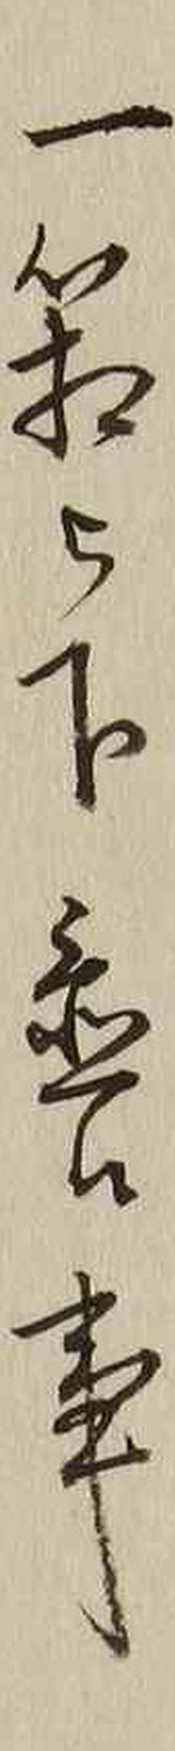一箱被下置候事
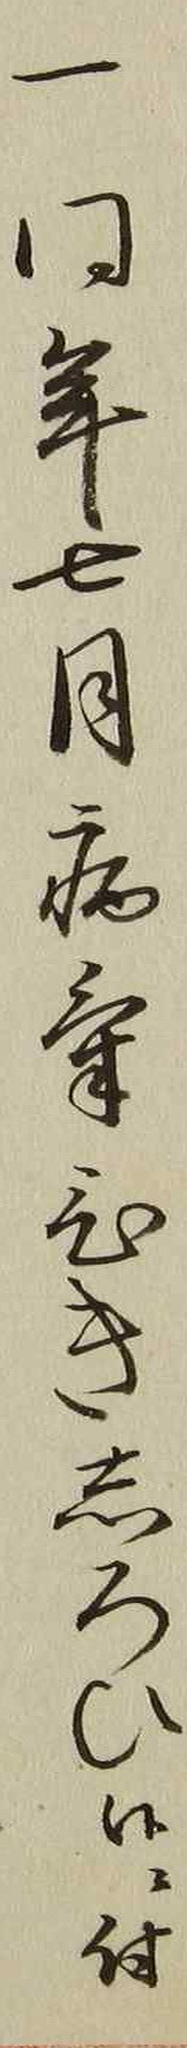一同年七月病気ひきしろひ候に付
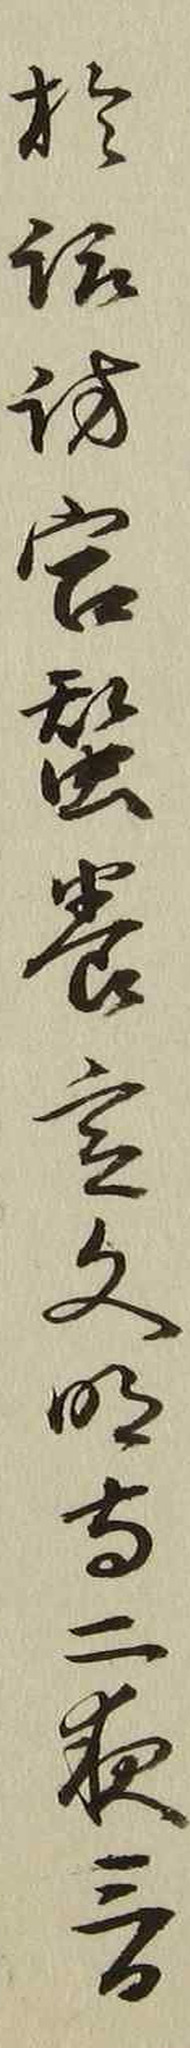於諏訪宮蚕養宮文明寺二夜三日
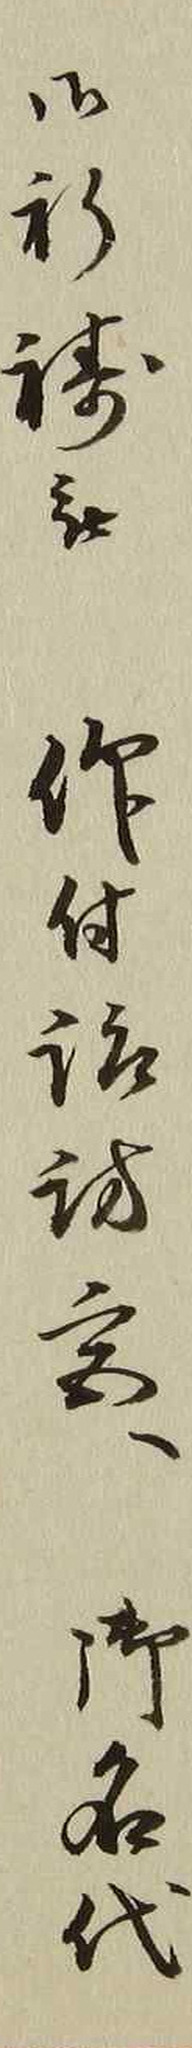御祈祷被仰付諏訪宮へ御名代
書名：諸士系譜　巻之125　た之部1
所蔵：会津若松市立会津図書館
